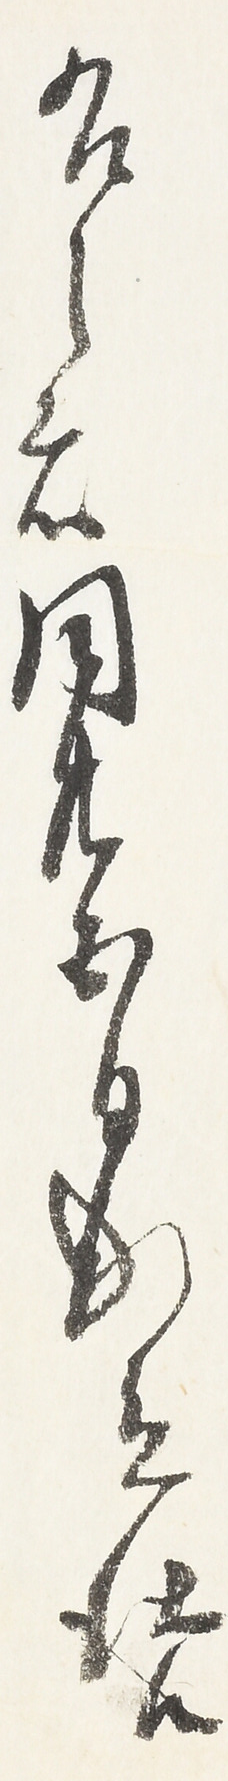右之者同廿五日出立仕候
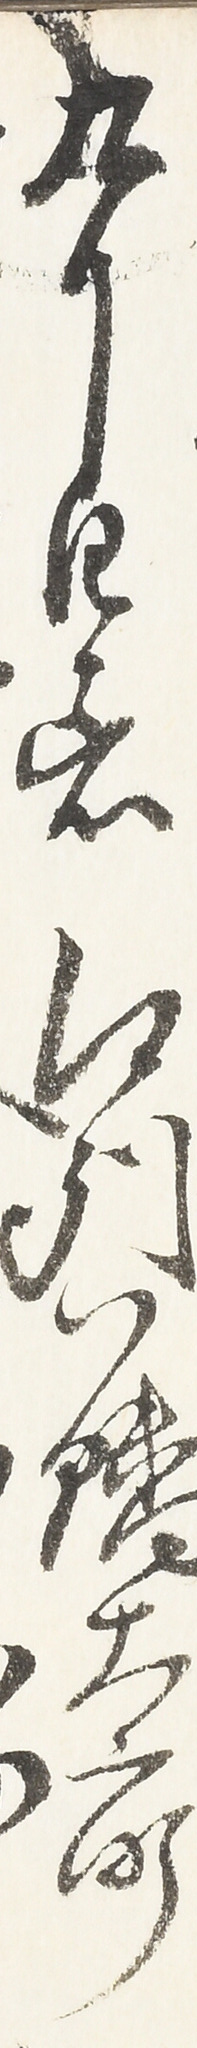九月四着江州八幡大工町
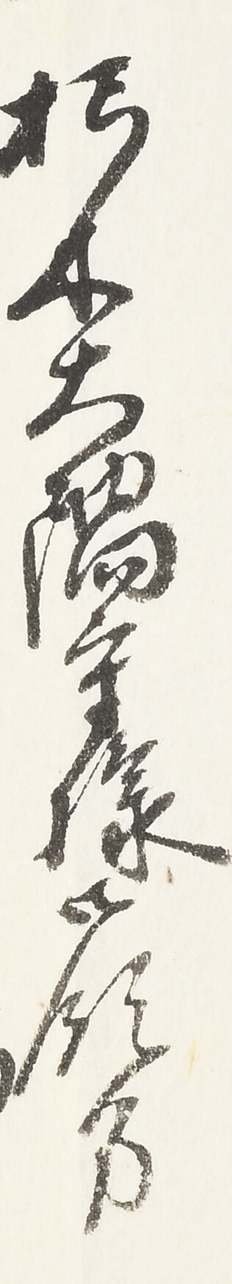朽木大隅守様御領分
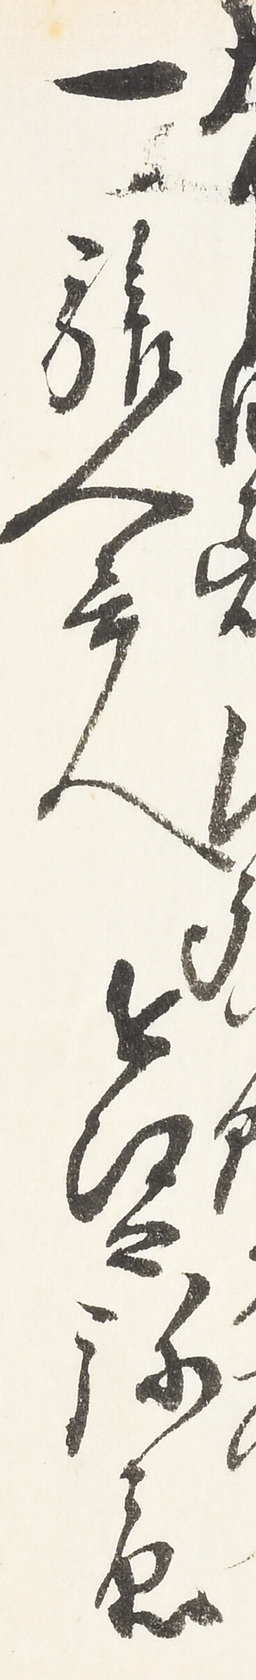一旅人壱人近江や弥兵衛
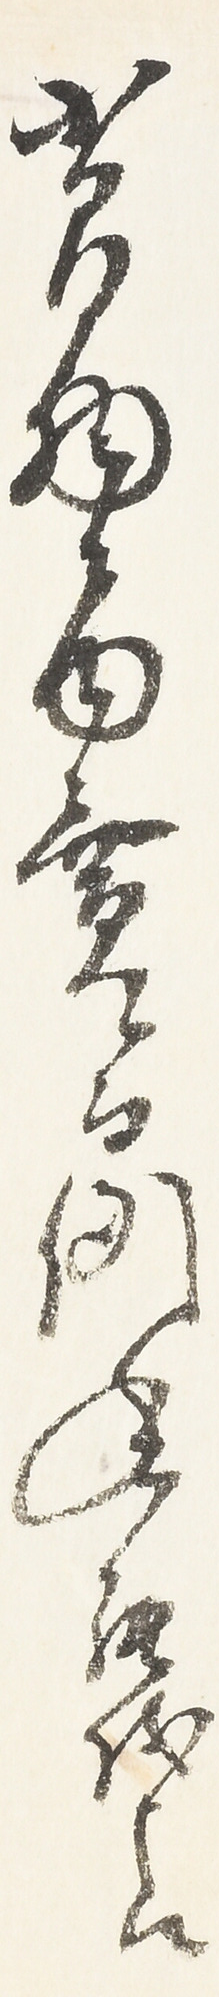小間物商売ニ而例年罷越申候
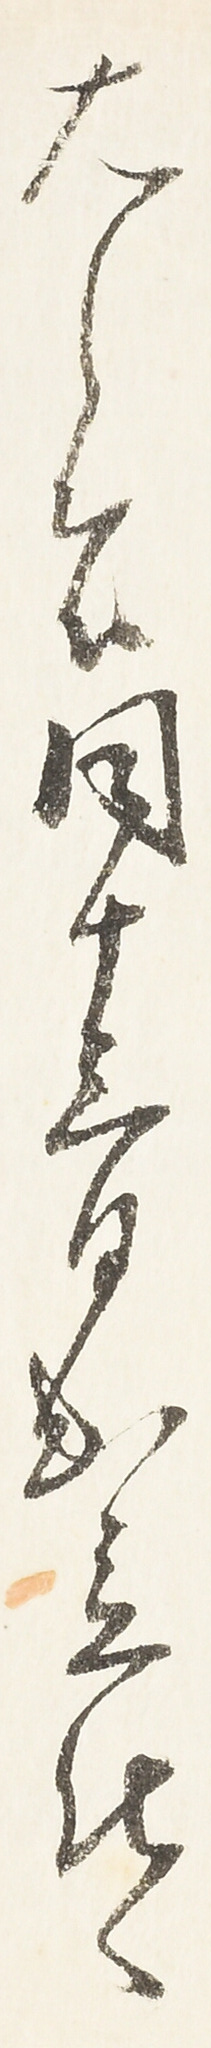右之者同十三日出立仕候
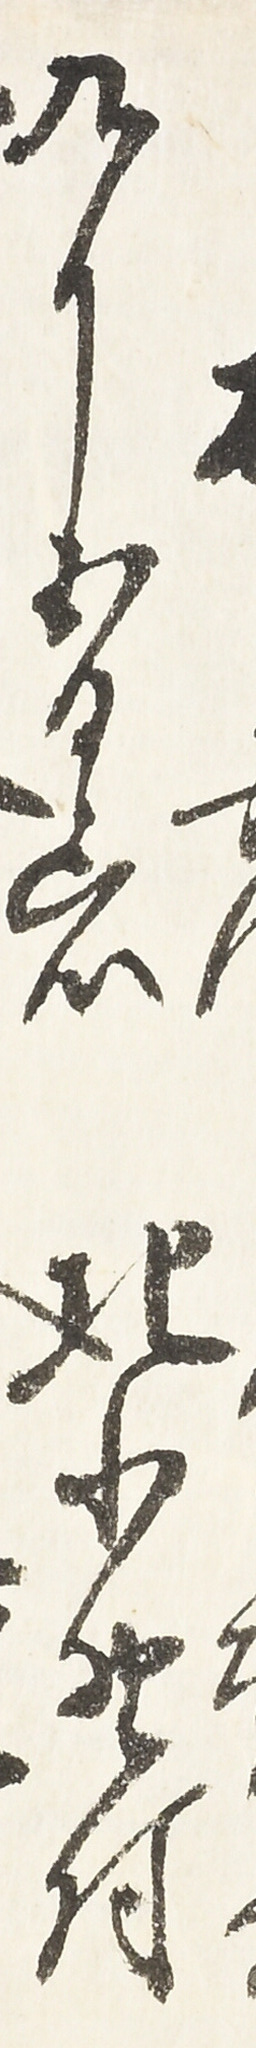九月五日着北小野村
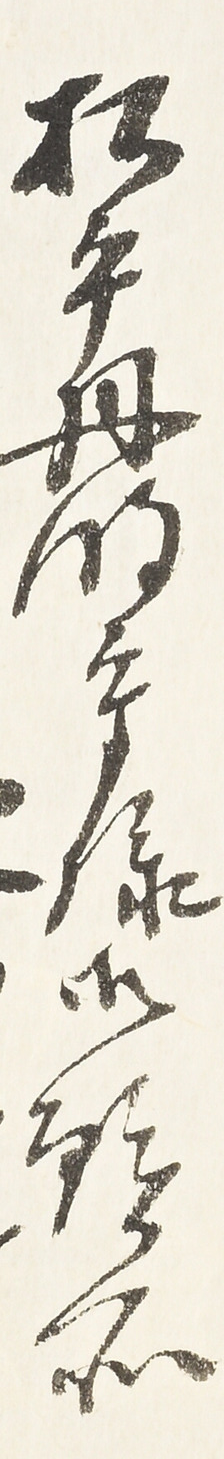松平丹波守様御預リ所
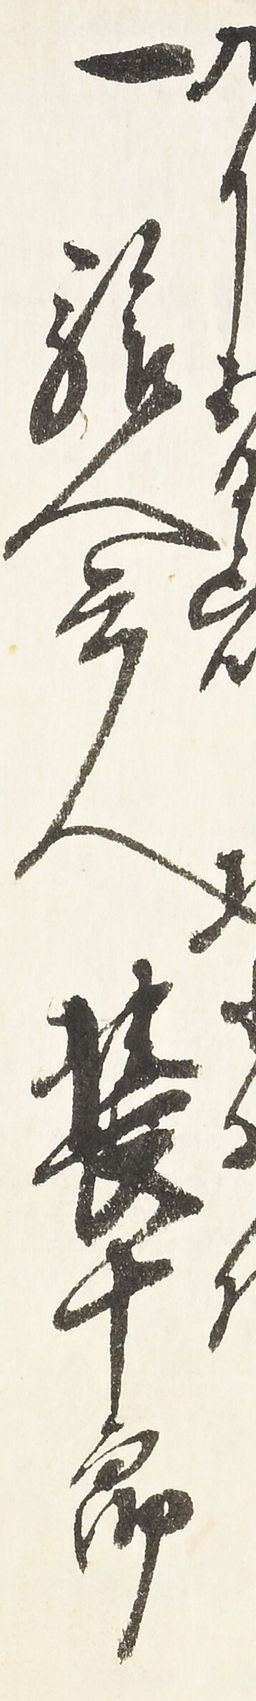一旅人壱人長十郎
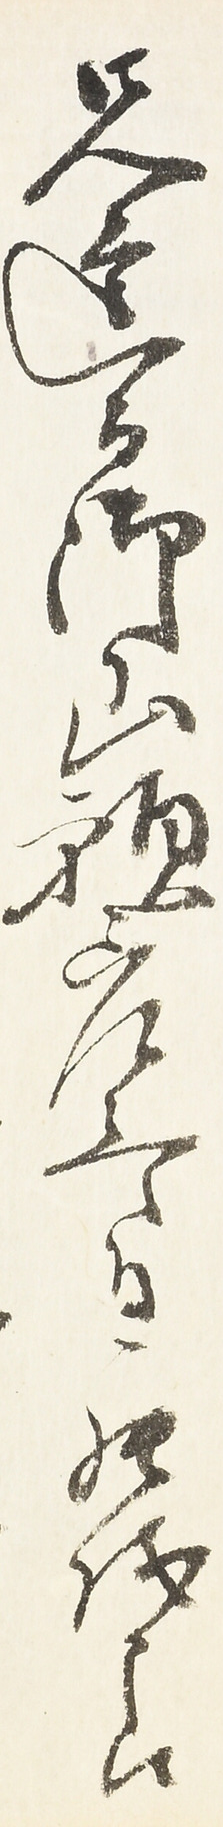先達而御山願差上候而罷越申候
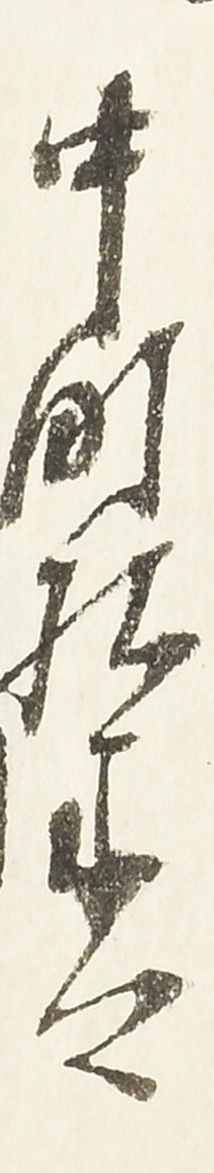中町松木や
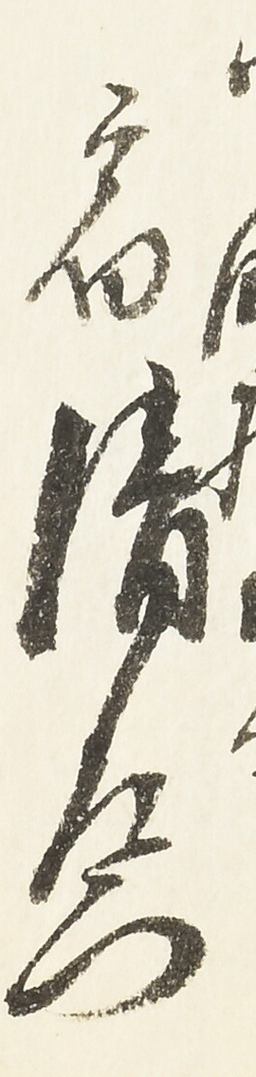宿清左衛門
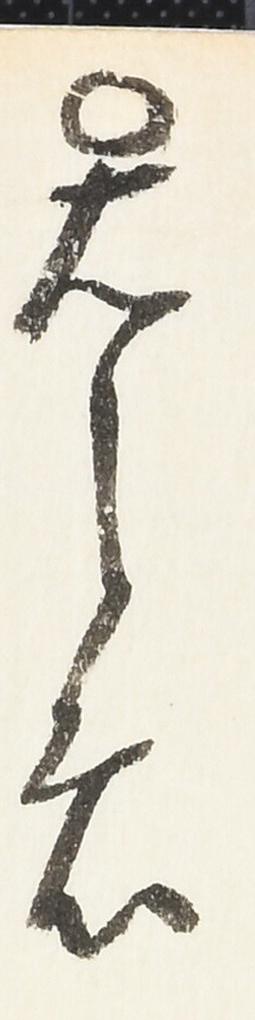〇右之者
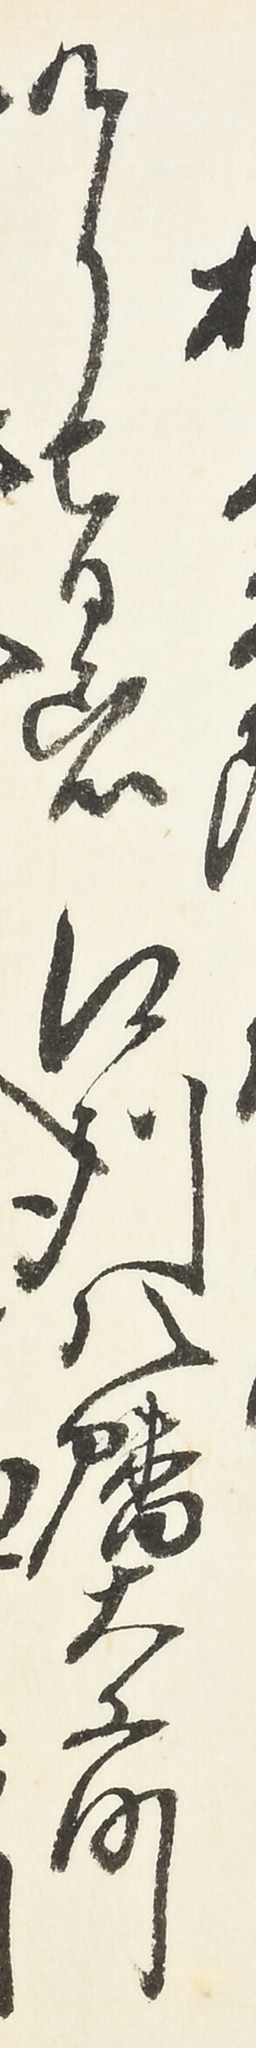九月七日着江州八幡大工町
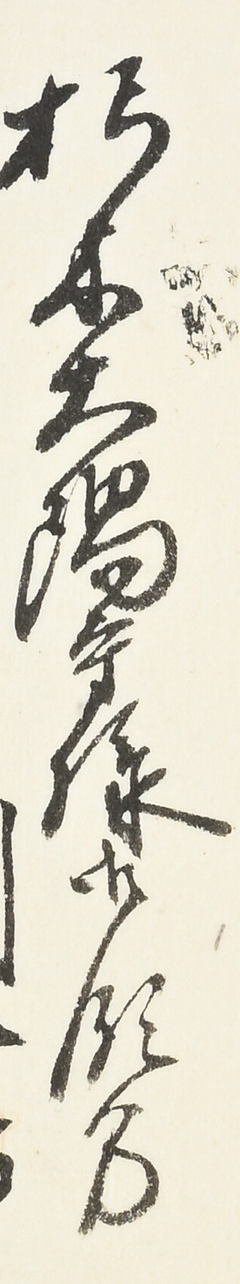朽木大隅守様御領分
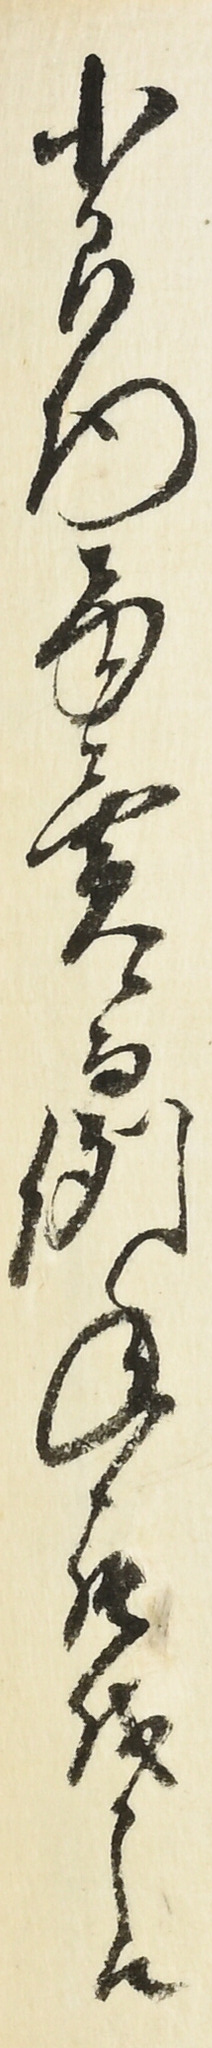小間物商売ニ而例年罷越申候
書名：町中旅人泊控帳
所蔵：伊那市立高遠町図書館・合同会社AMANE
